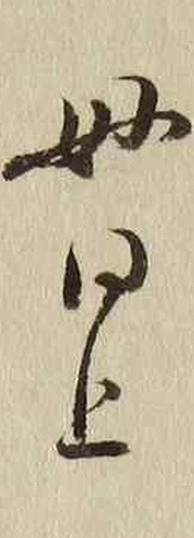母同上
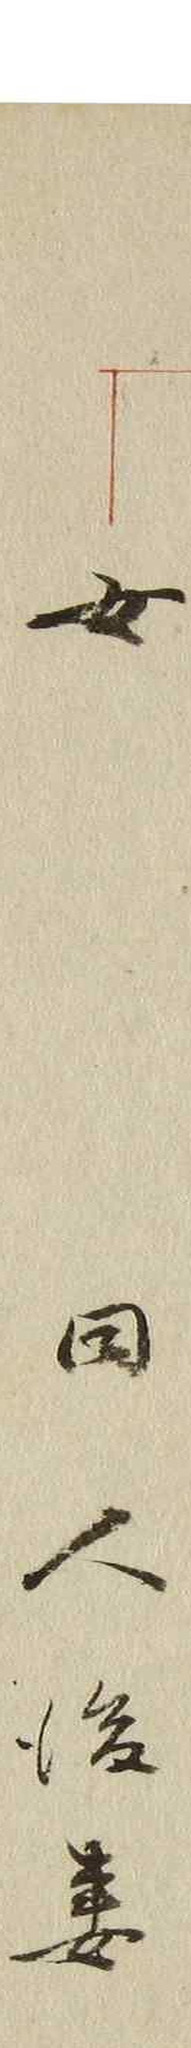女同人後妻
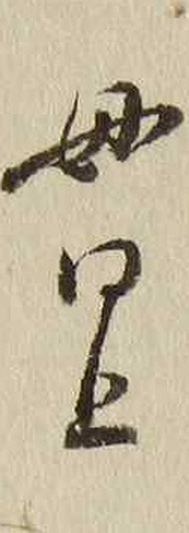母同上

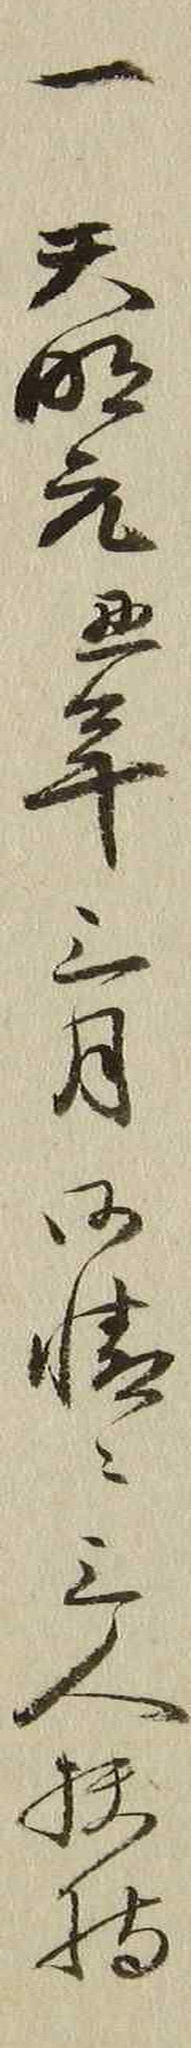一天明元丑年三月御情ニ三人扶持
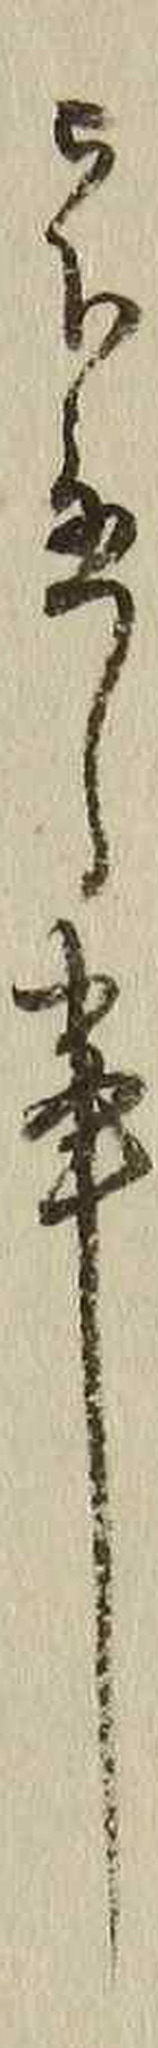被下置候事
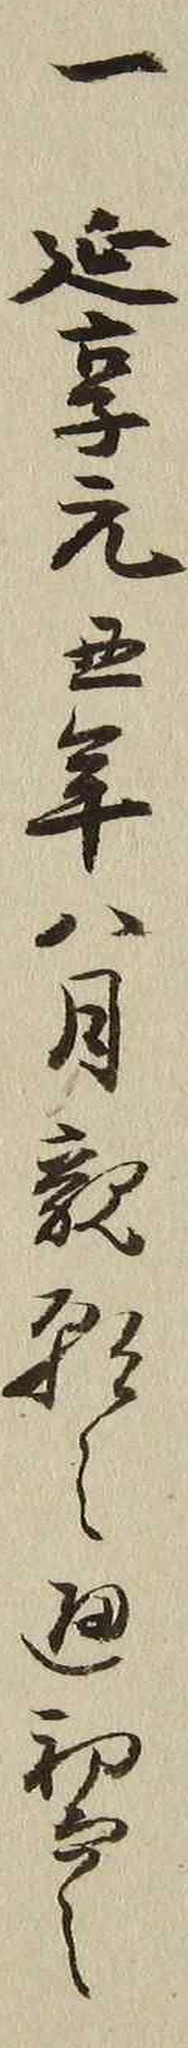一延享元丑年八月親願之通初而之
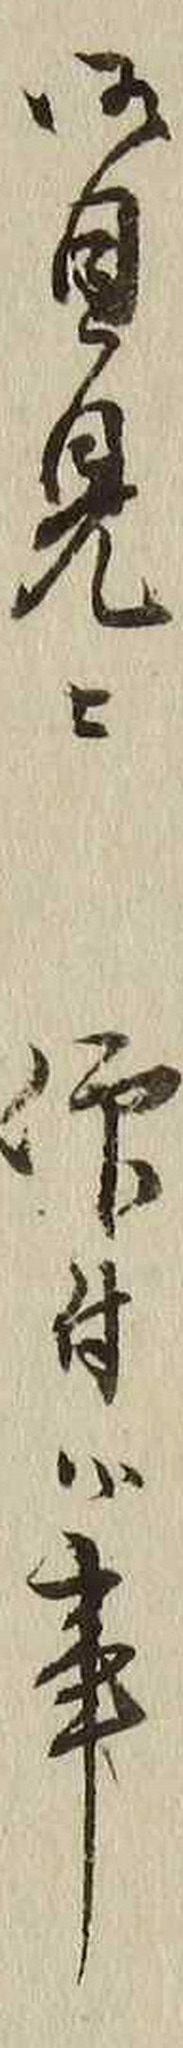御目見被仰付候事
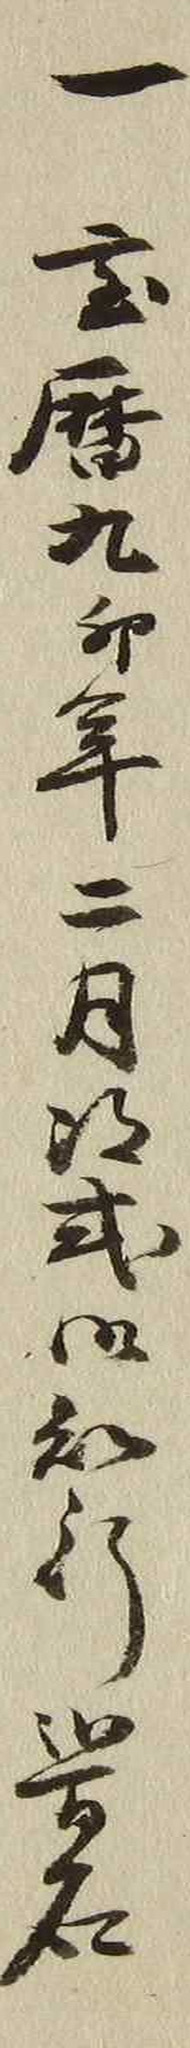一室暦九卯年二月跡式御知行弐百石
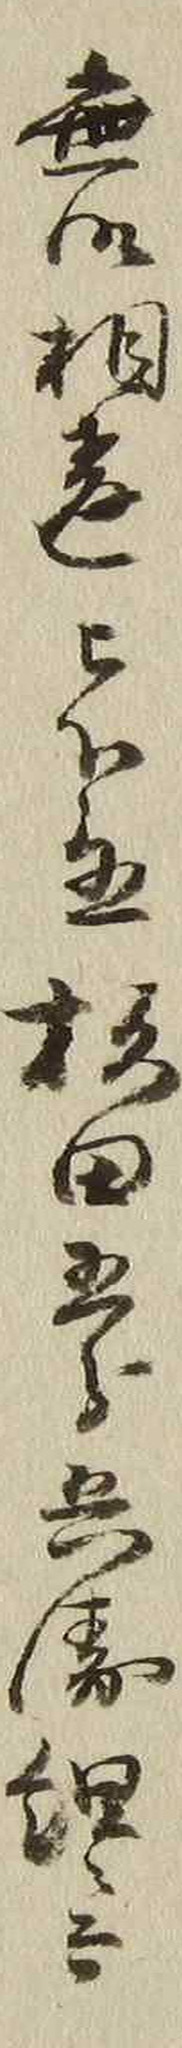無御相違被下置杉田五郎兵衛組ニ而
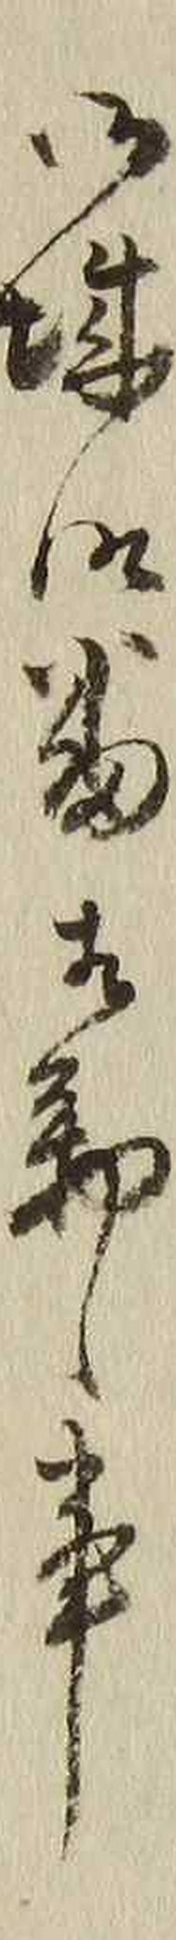御城御番相勤候事
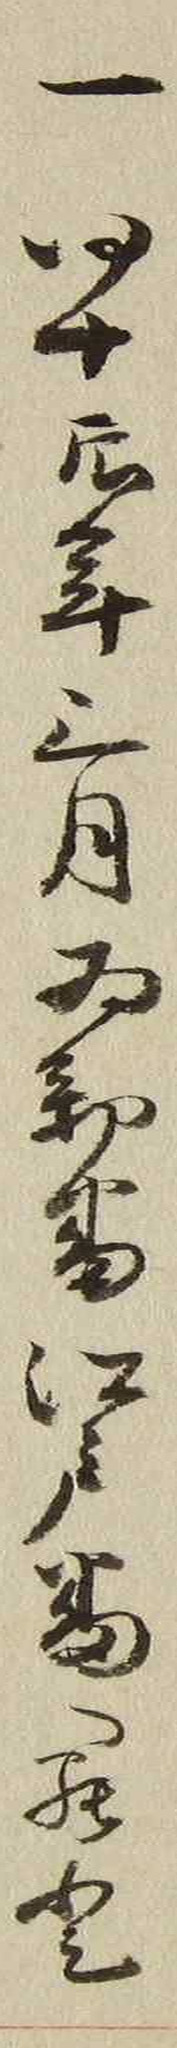一同十辰年三月為勤番江戸番へ罷登
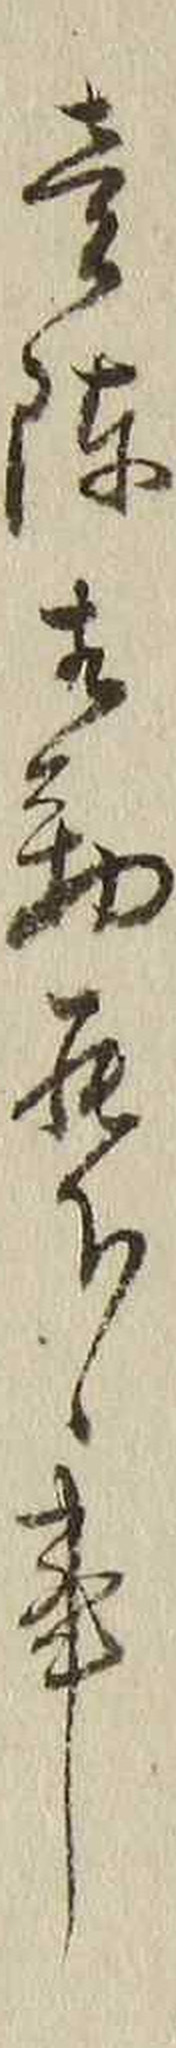壱陣相勤罷下候事
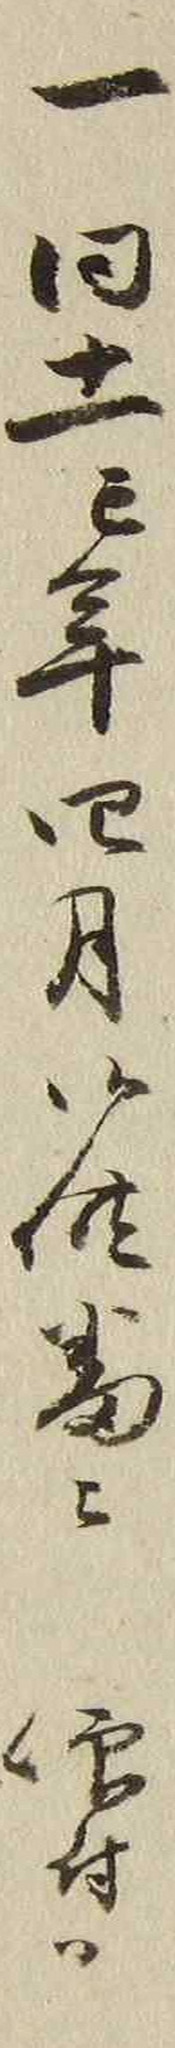一同十一巳年四月御供番被仰付候
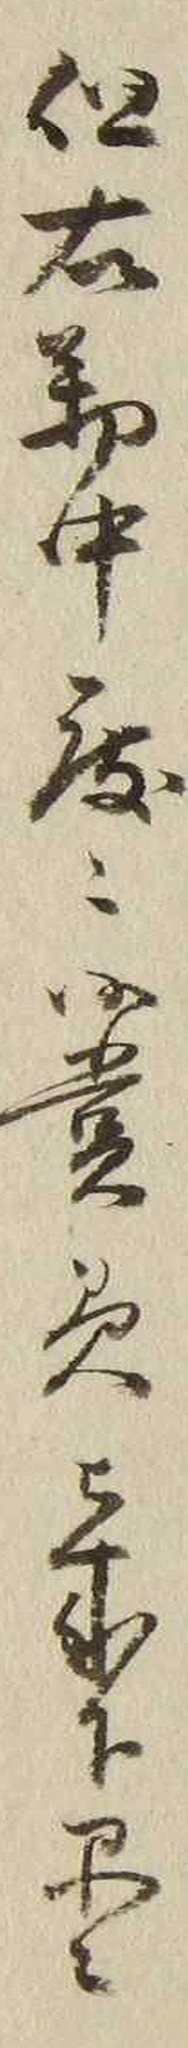但右勤中度々御賞美被成下置候
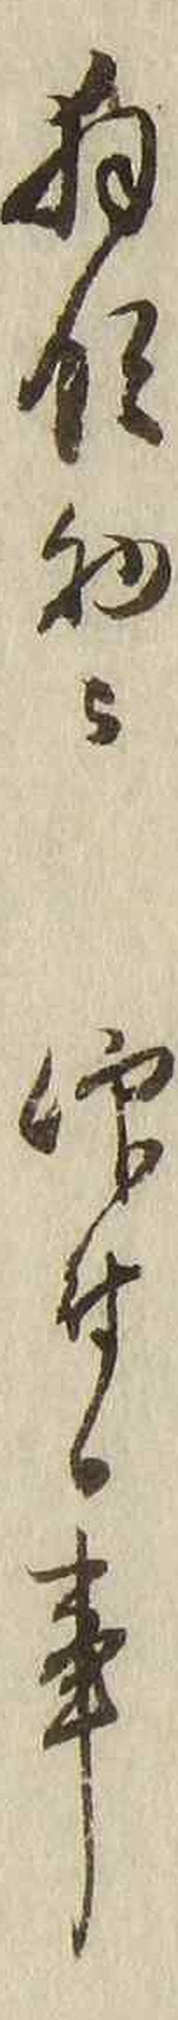拝領物被仰付候事

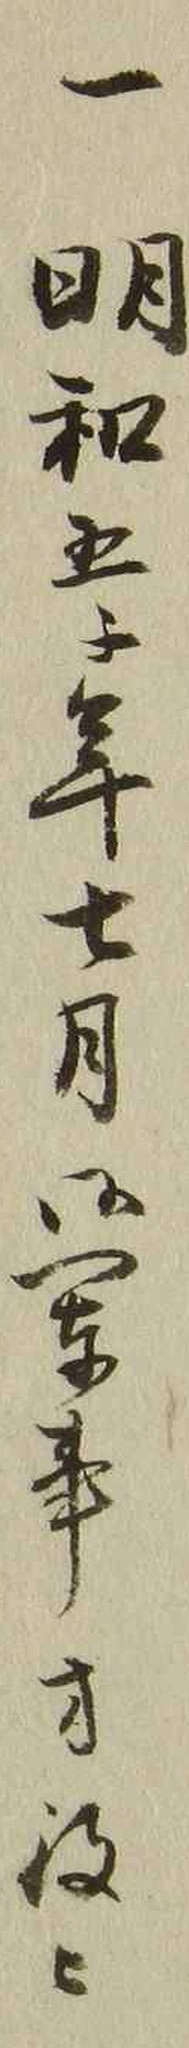一明和五子年七月御軍事方役被
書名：諸士系譜　巻之236　ふ之部4
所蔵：会津若松市立会津図書館
